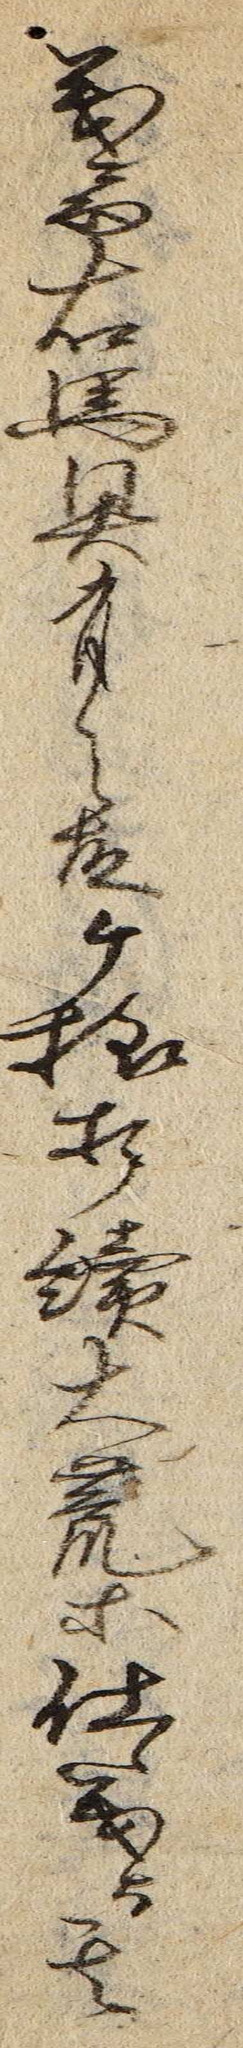義にて右馬具有之故ケ様打続大荒等仕候義と其

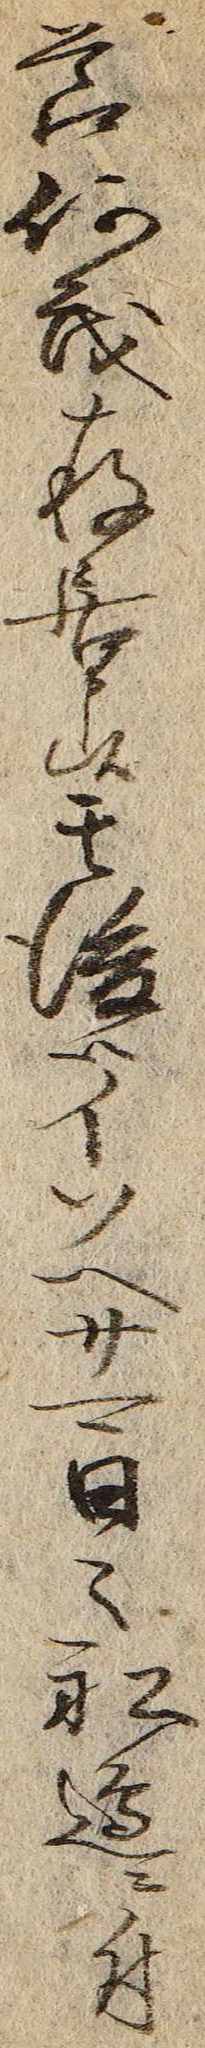節何も存居申候其後はイソヘサマ日々船辺に付
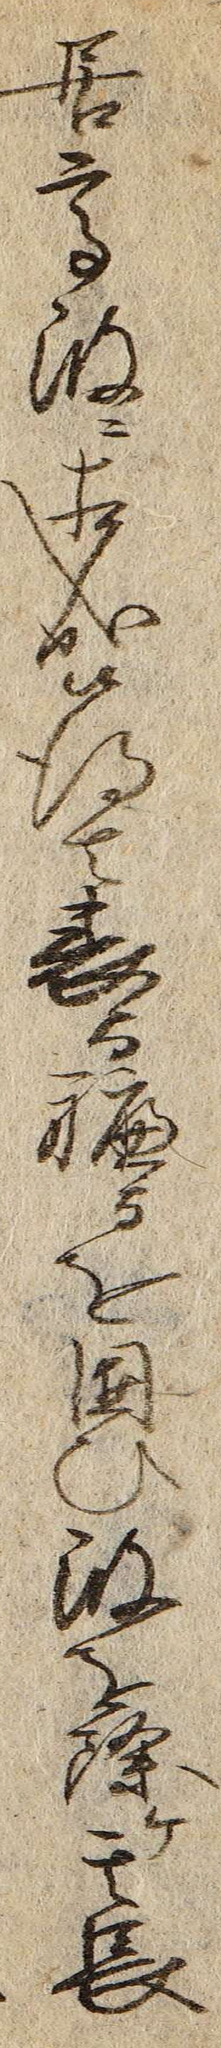居高波に相成候得ば表と艫？とを囲ひ波を除ケ其長
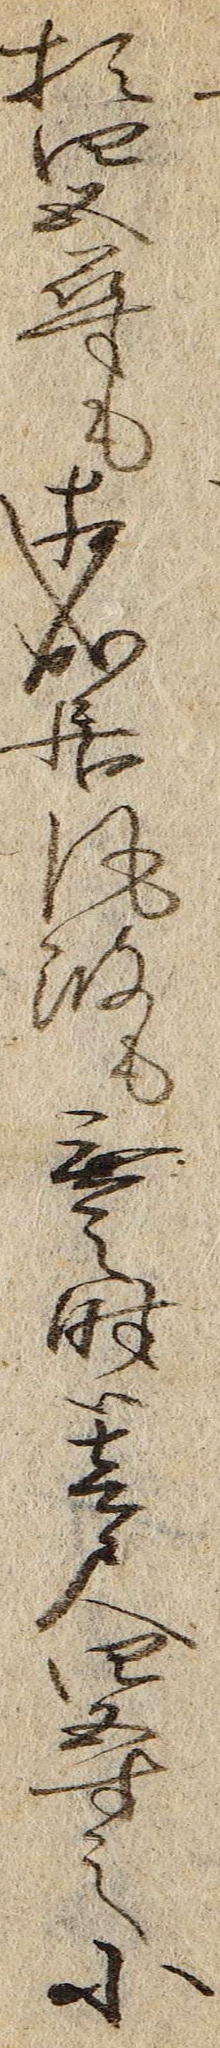拾四五尋も相成居風波も無之時は一尺四五寸の小
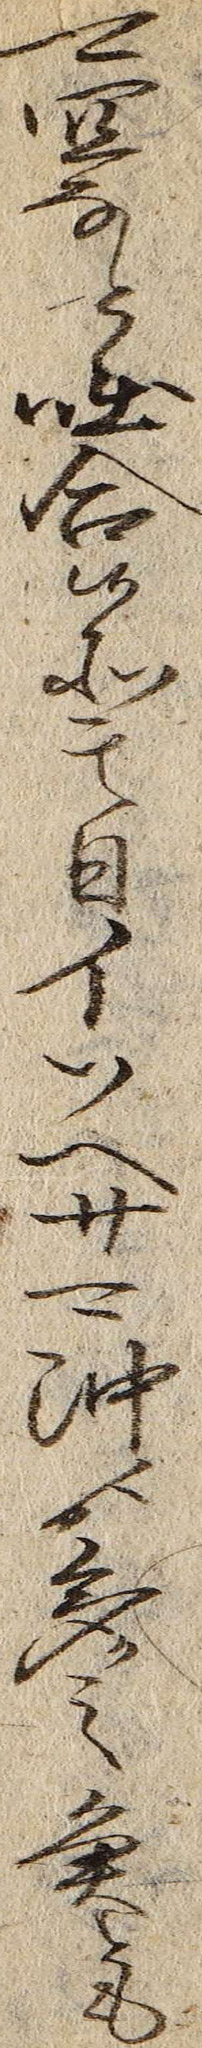可宣なと咄合候所其日イソヘサマ沖より多クの魚とも
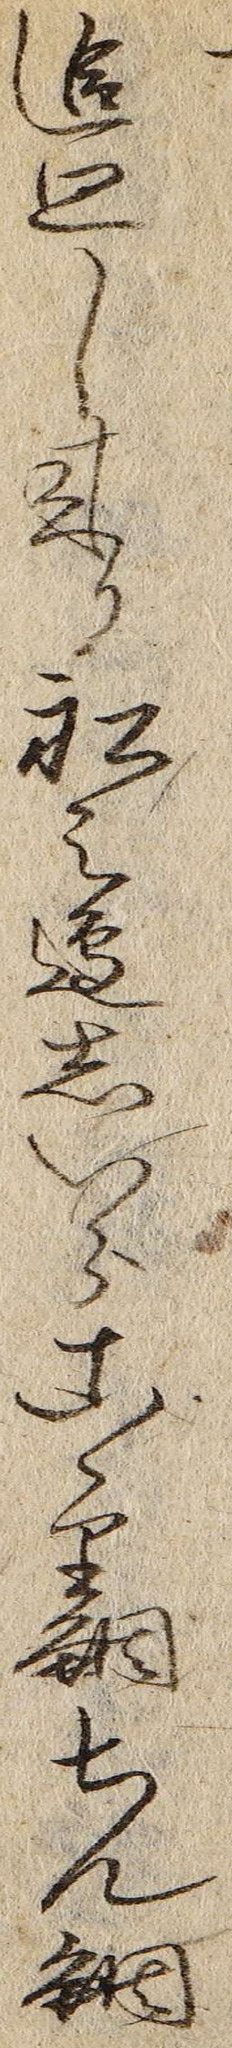追廻し来り船の辺しいらこゝり鯛ちん鯛
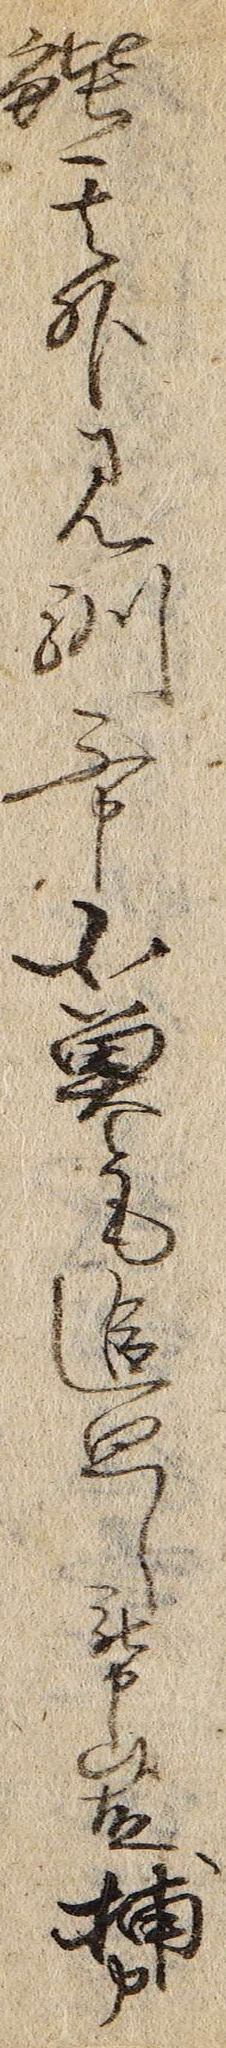鰹其外見馴不申小魚ともおい追廻し被申候故捕申
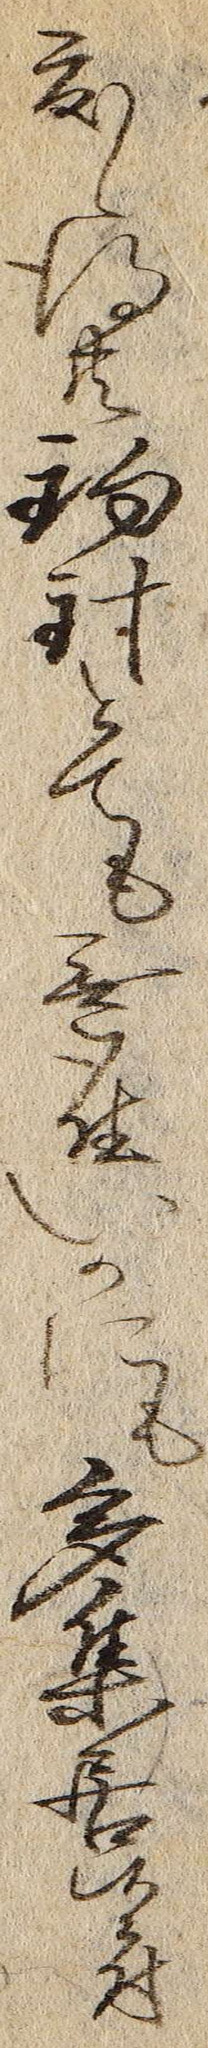度候得ども釣針とても無御座いかにも多集居候に付
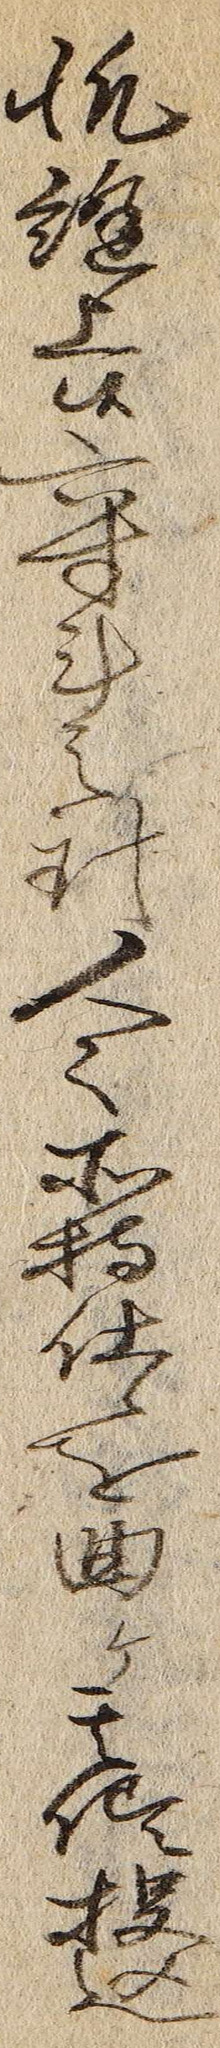帆縫上候六寸斗の針人々所持仕候を曲ケ其侭投込
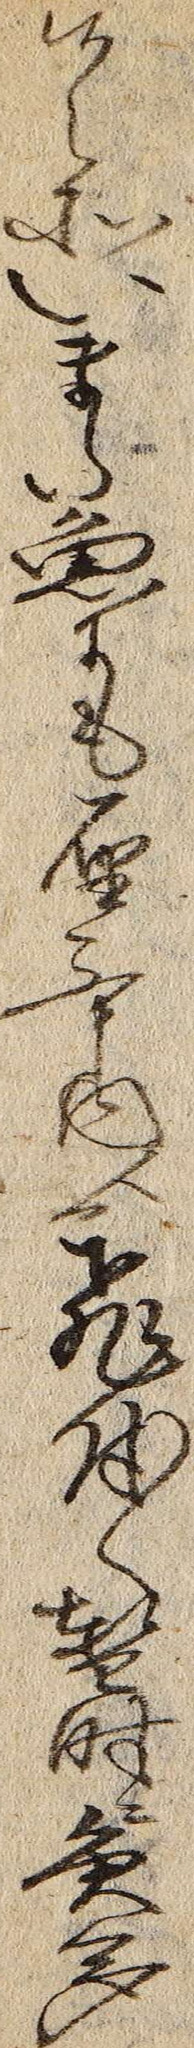候の所いまた魚にも届不申内より飛付〳〵暫時に魚多
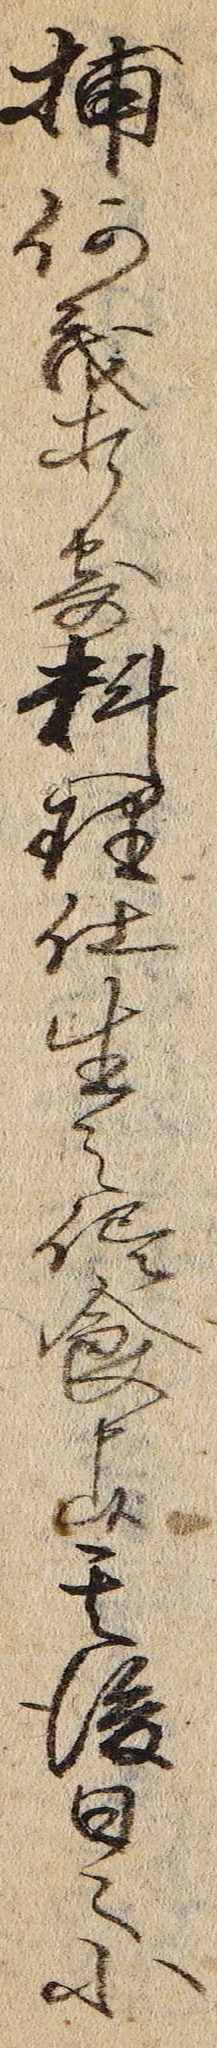捕何も打寄料理仕生の侭食申候其後日々小
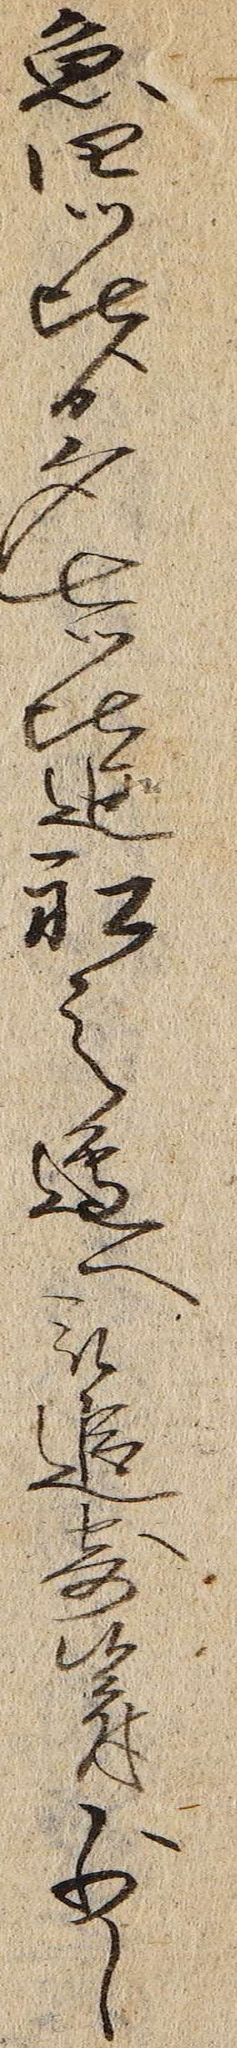魚四ツ頃より夕七ツ頃まで船の辺へ被追寄候に付少し
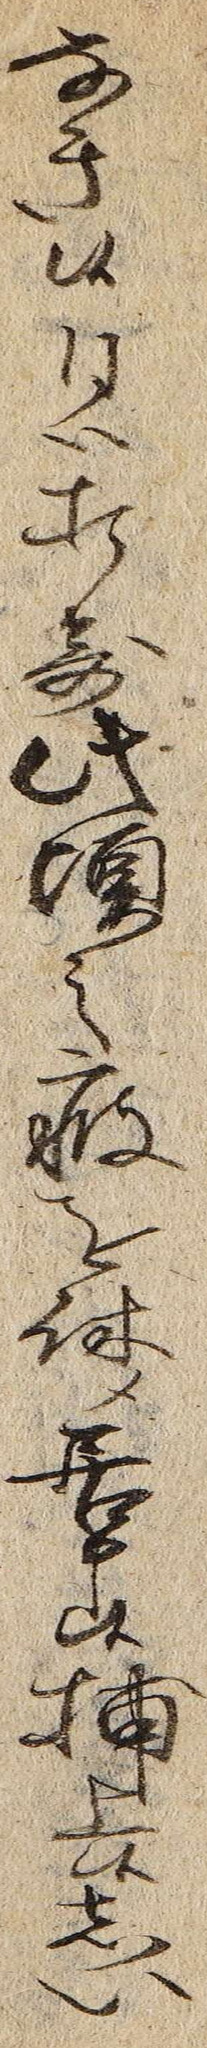なき候日は打寄此頃の疲を休メ居申候捕上候しい
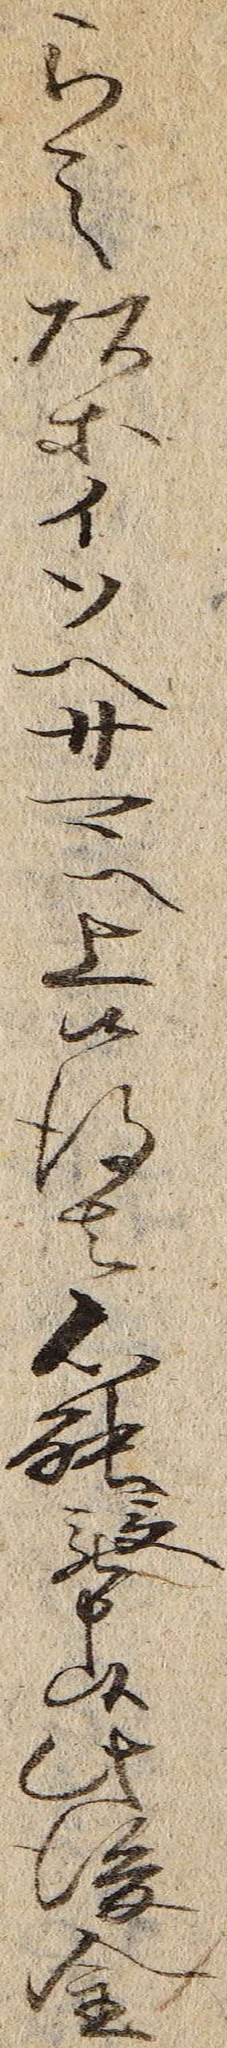らの頭等イソヘサマへ上候得ば心能受被申候此後金
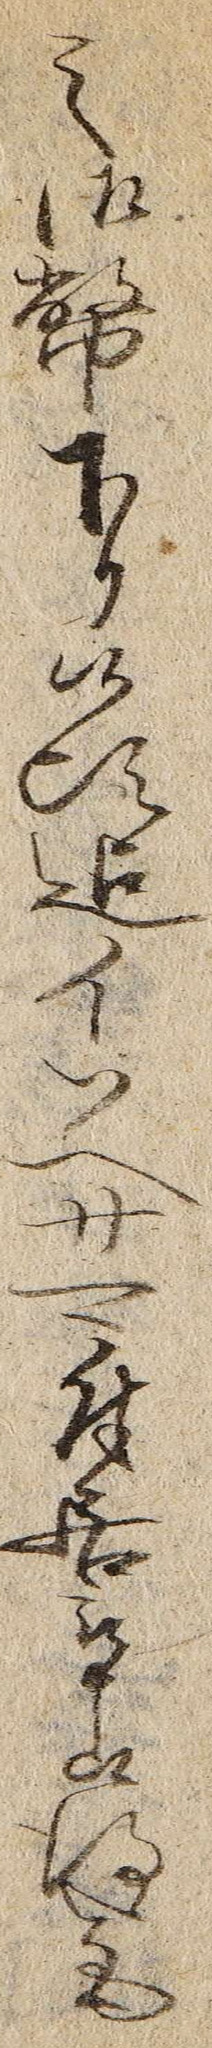の御幣下り候頃までイソヘサマ付居被申候得とも
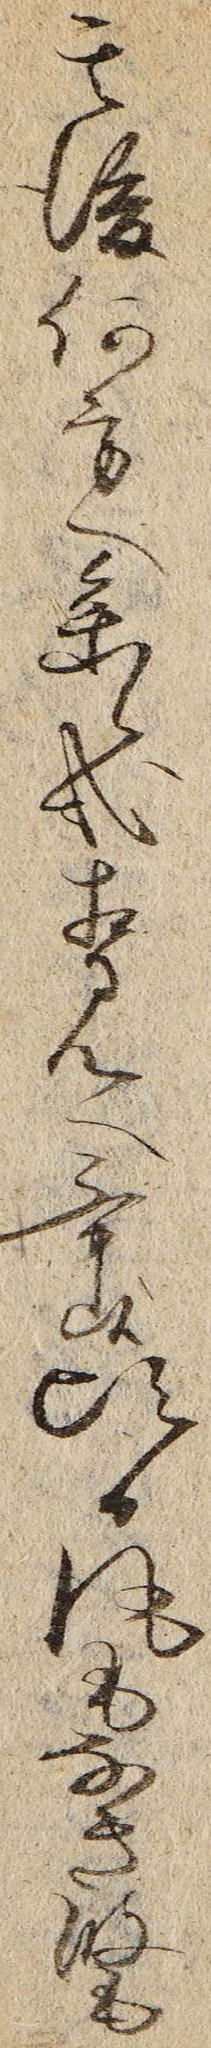其後何方へ参候哉相見へ不申候頃日風もなき波も
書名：能登国清兵衛異国江漂流之始末
